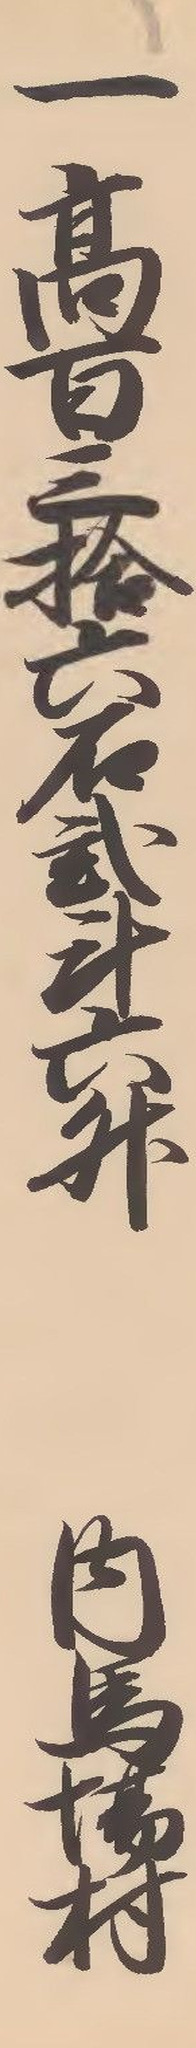一高百三拾六石弐斗六升内馬場村
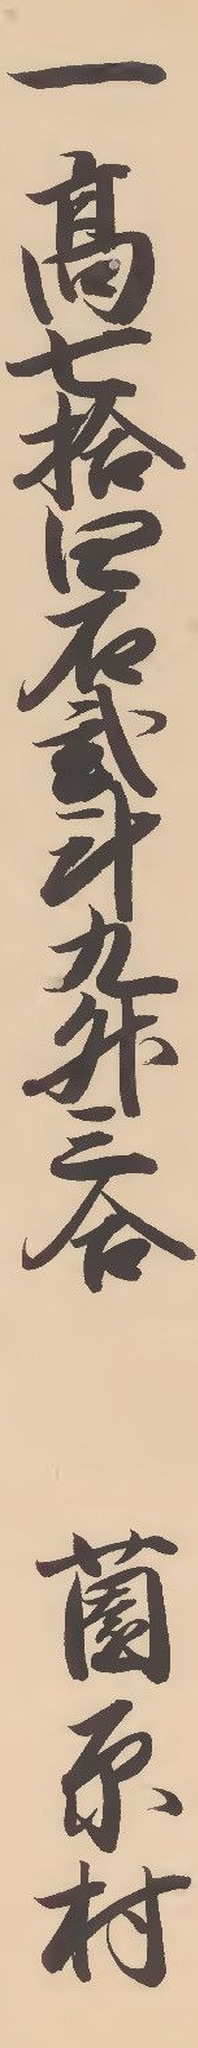一高七拾四石弐斗九升三合園原村
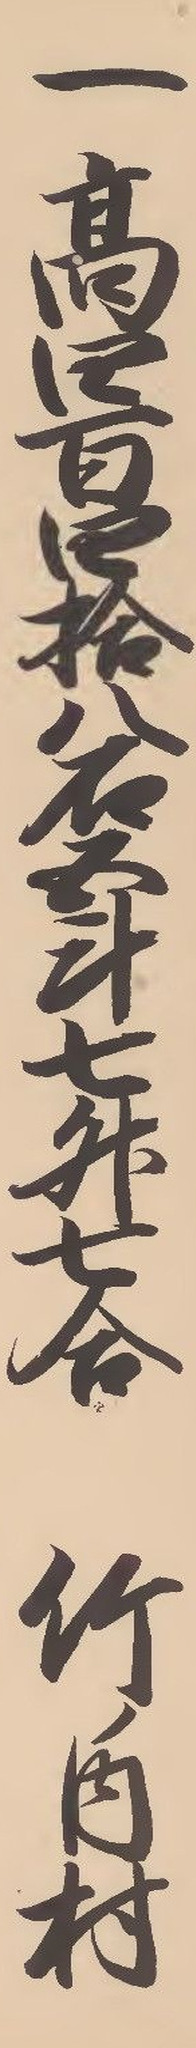一高四百四拾八石五斗七升七合竹ノ内村
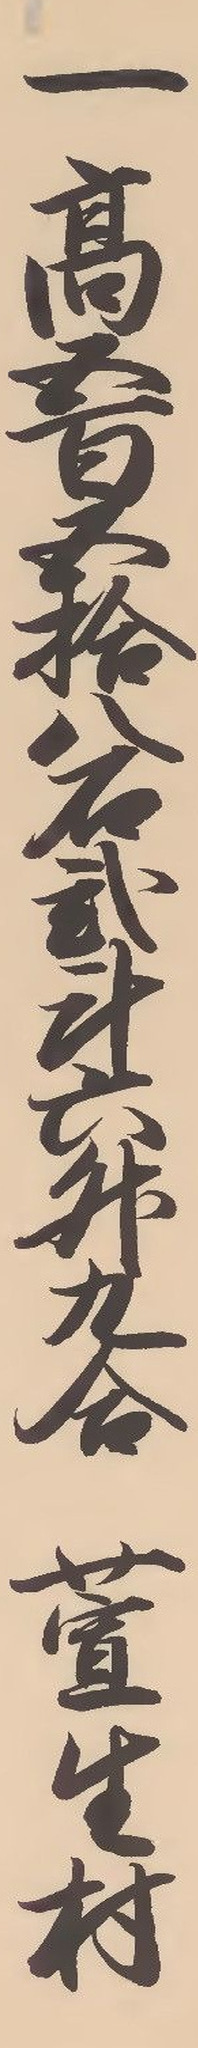一高五百五拾八石弐斗六升九合萱生村
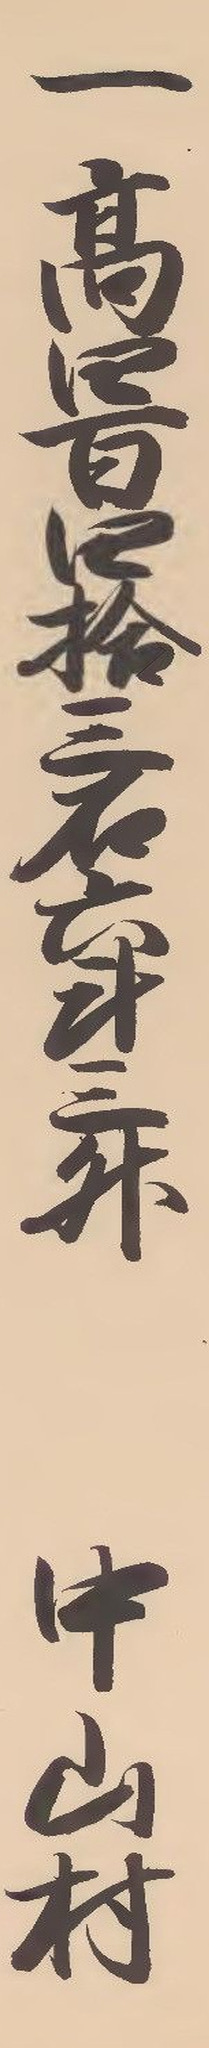一高四百四拾三石六斗三升中山村
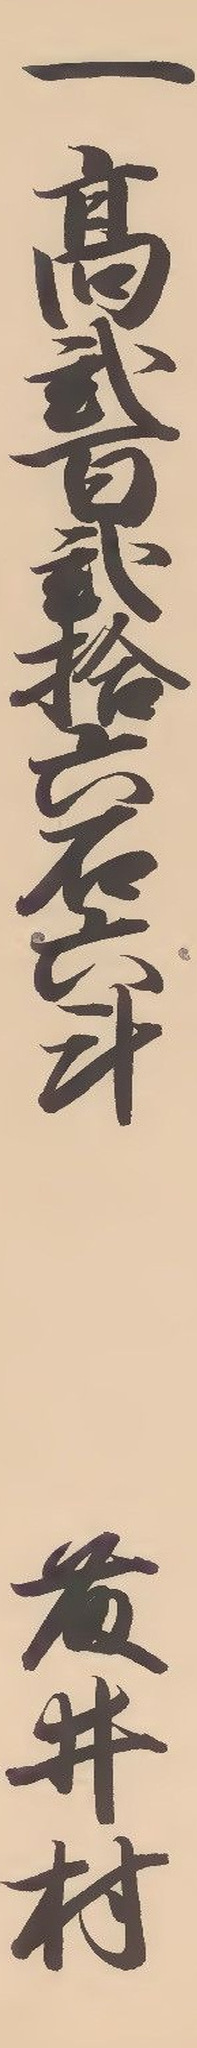一高弐百弐拾六石六斗藤井村

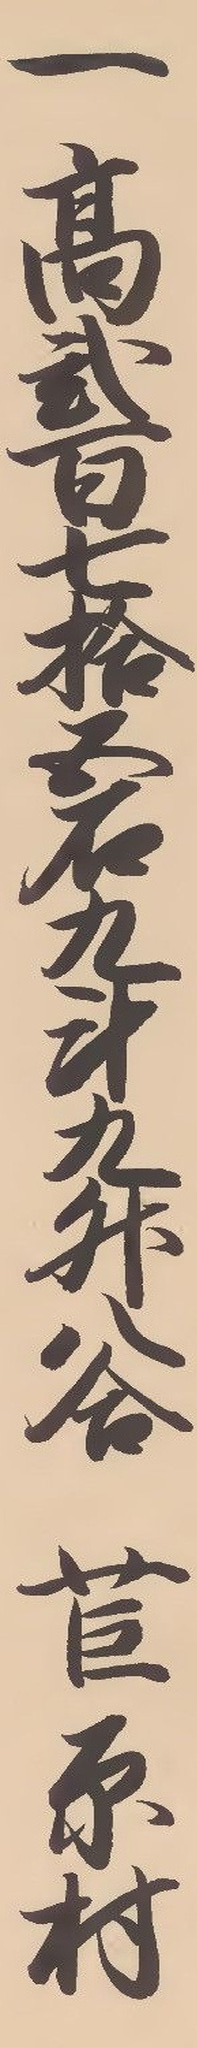一高弐百七拾五石九斗九升八合苣原村
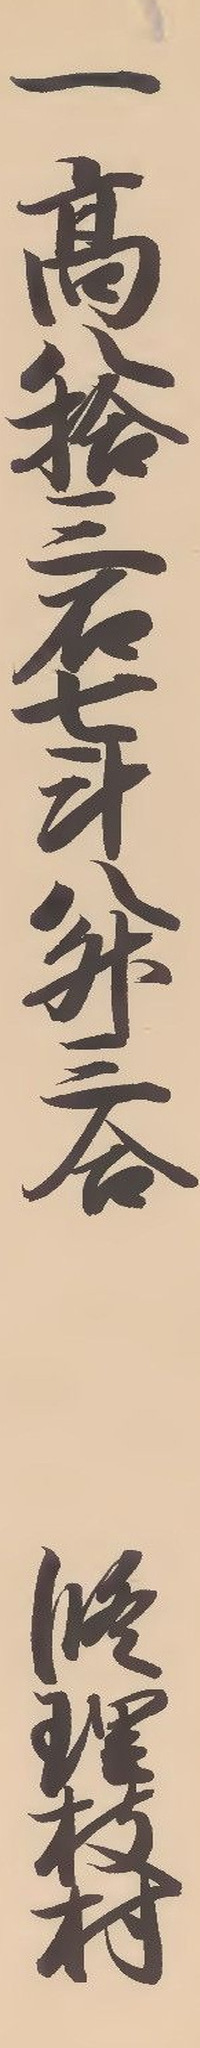一高八拾三石七斗八升三合修理枝村
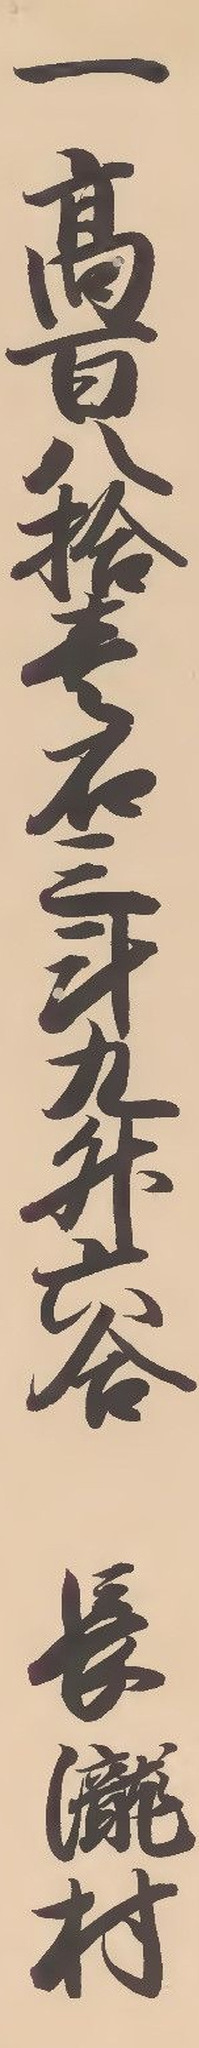一高百八拾壱石三斗九升六合長滝村
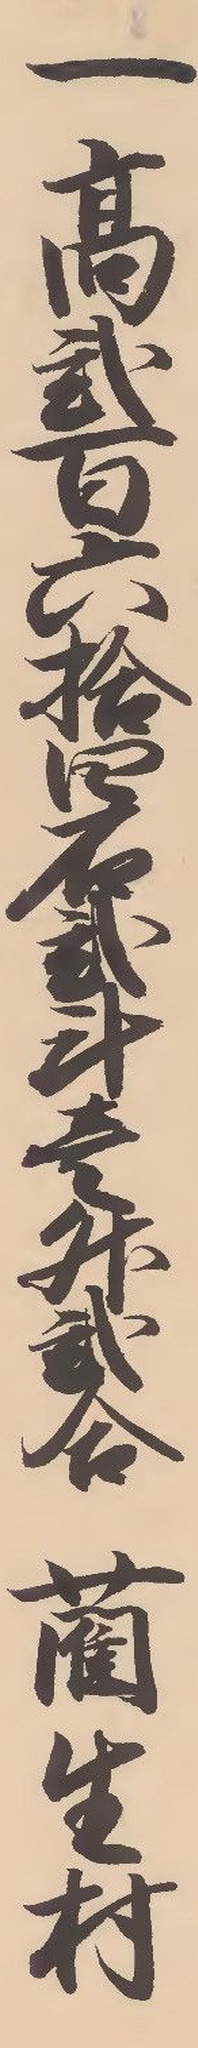一高弐百六拾四石弐斗壱升弐合藺生村
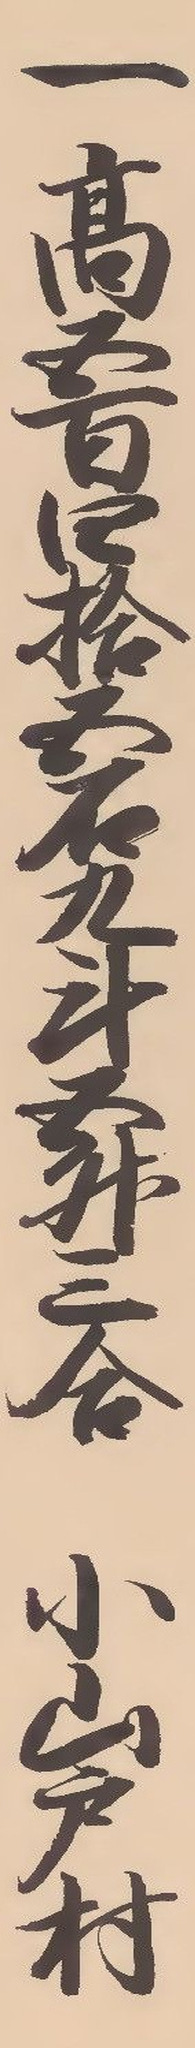一高五百四拾五石九斗五升三合小山戸村
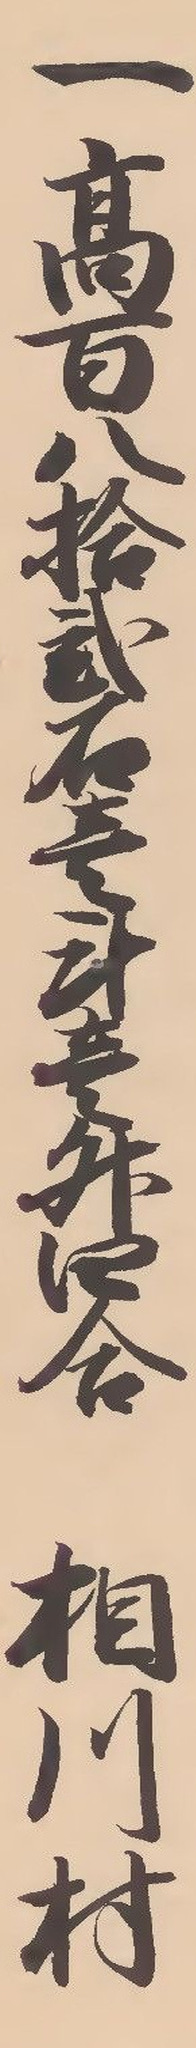一高百八拾弐石壱斗壱升四合相川村

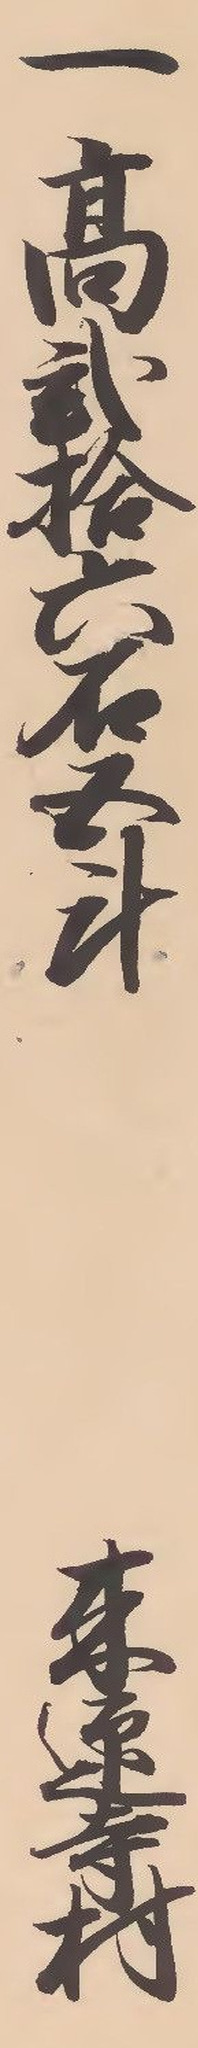一高弐拾六石五斗来迎寺村
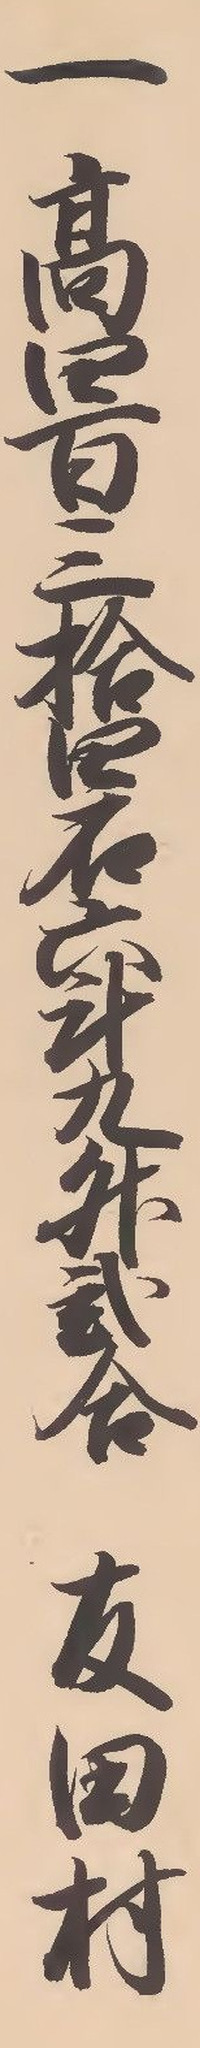一高四百三拾四石六斗九升弐合友田村
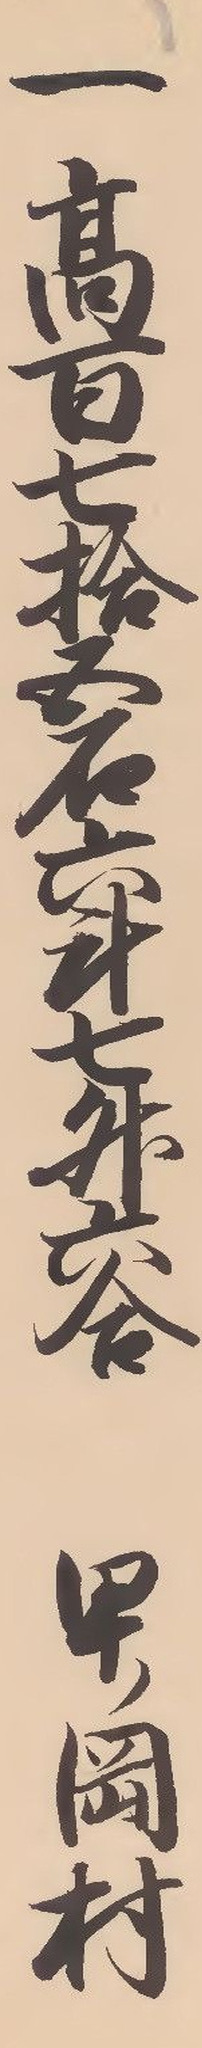一高百七拾五石六斗七升六合甲ノ岡村
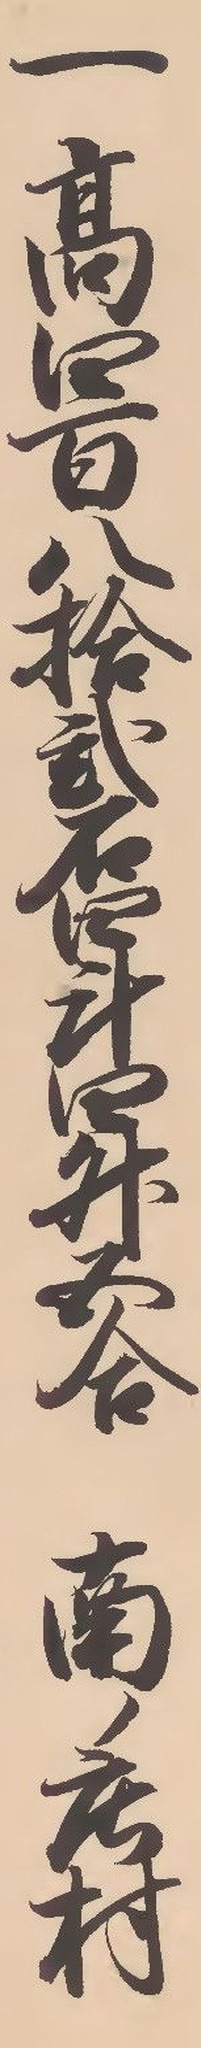一高四百八拾弐石四斗四升五合南ノ庄村
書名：大和国郷帳
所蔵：国立公文書館 National Archives of Japan
